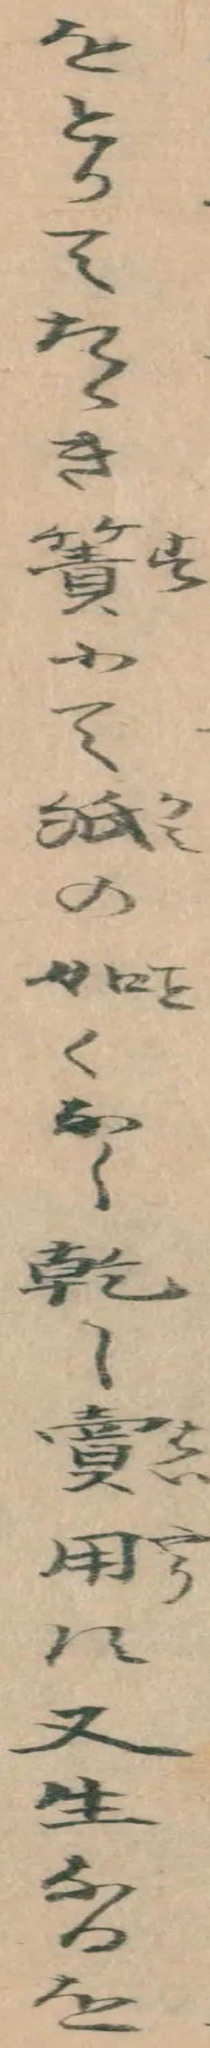をとりてたゝき簀にて紙の如くなし乾し売用す又生なるを

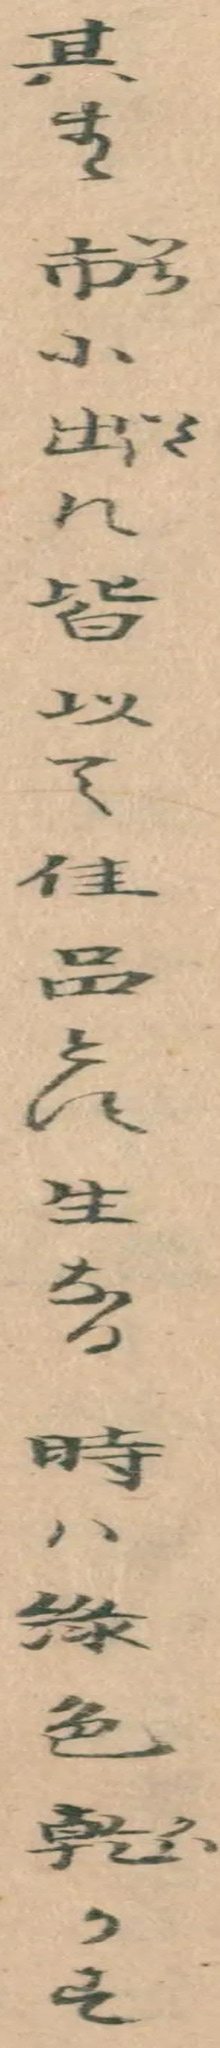其まゝ市に出す皆以て佳品とす生なる時は緑色乾かす
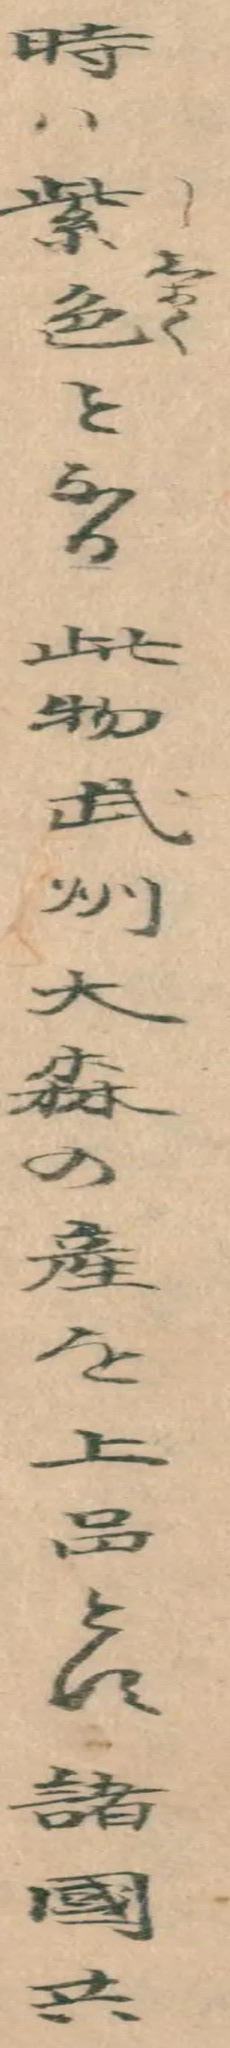時は紫色となる此物武州大森の産を上品とす諸国共
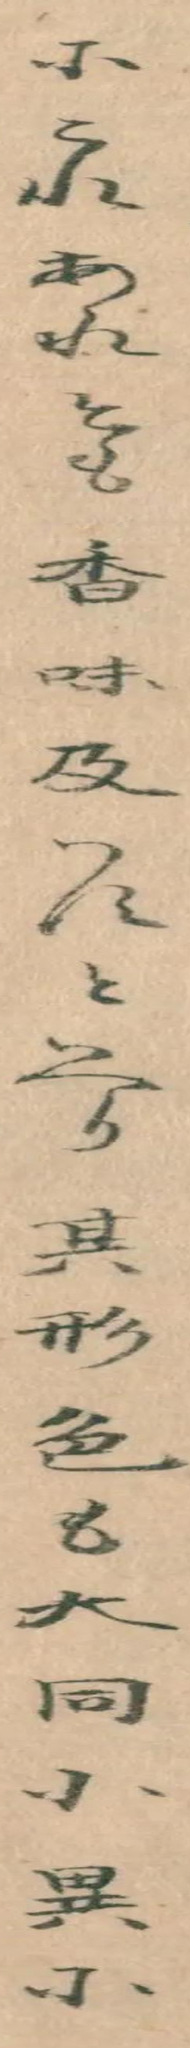にこれあれとも香味及すといへり其形色も大同小異に
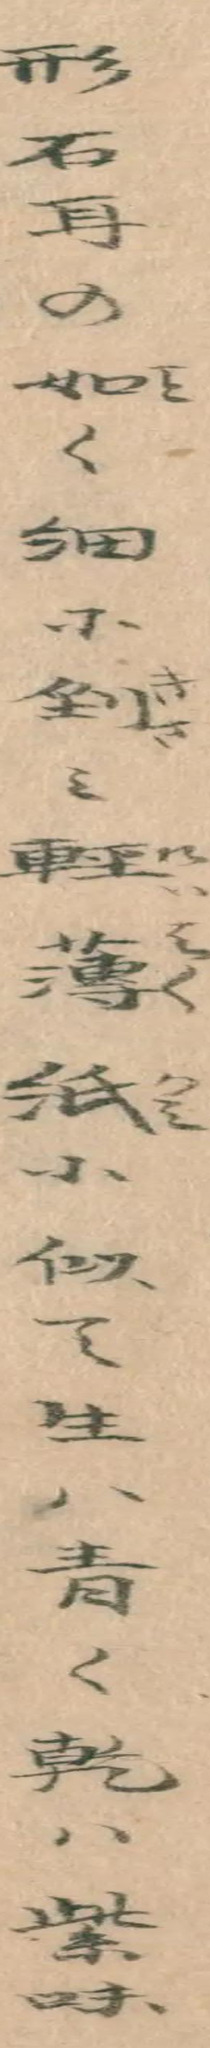形石耳の如く細に剉み軽薄紙に似て生は青く乾は紫味
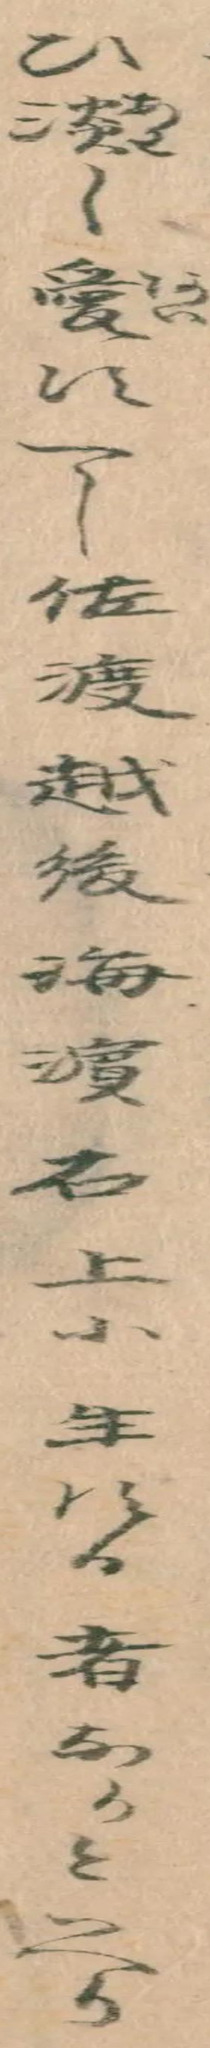ひ淡し愛すへし佐渡越後浜辺石上に生する者なりといへり
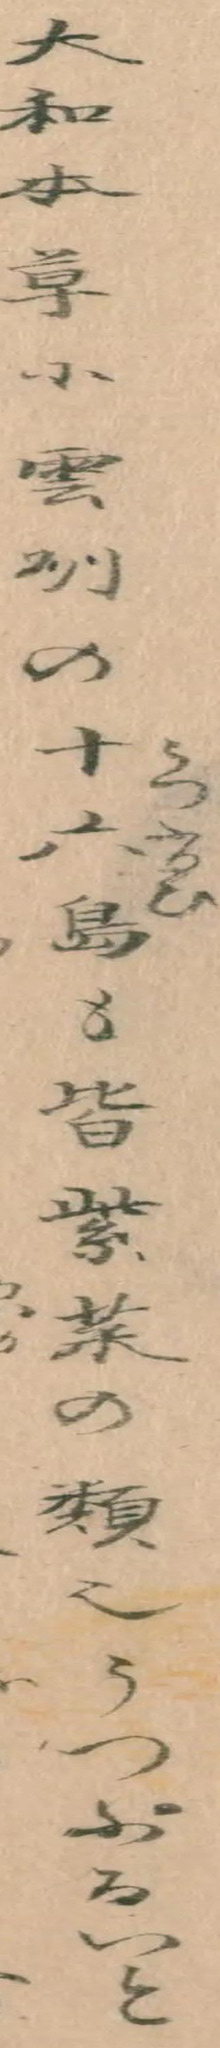大和本草に雲州の十六島も皆紫菜の類也うつぷるいと
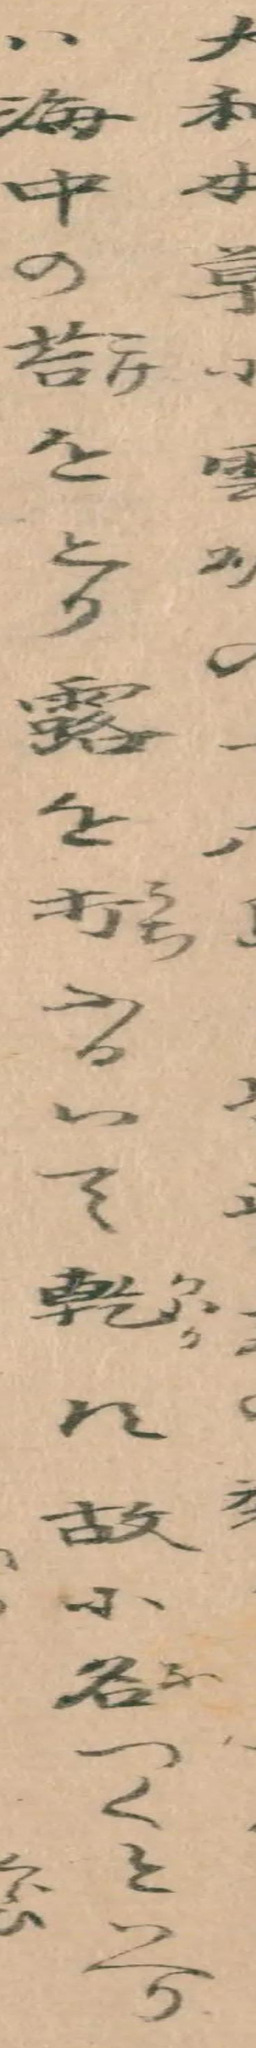は海中の苔をとり露を打ふるいて乾す故に名つくといへり
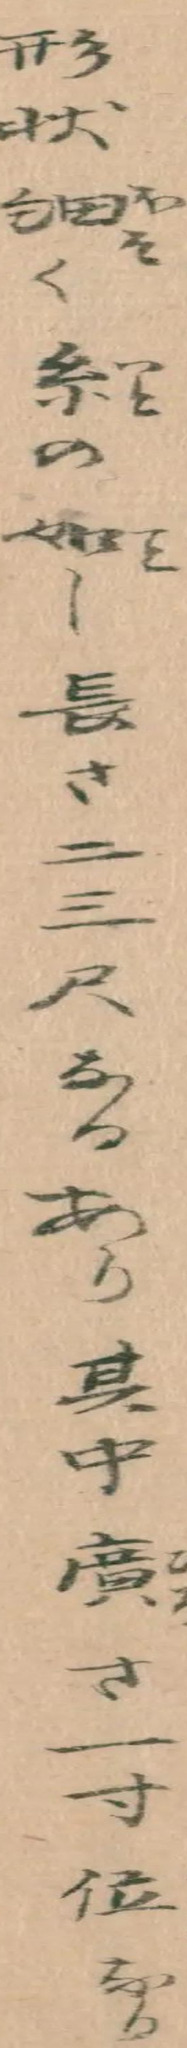形状細く糸の如し長さ二三尺なるあり其中広さ一寸位なり
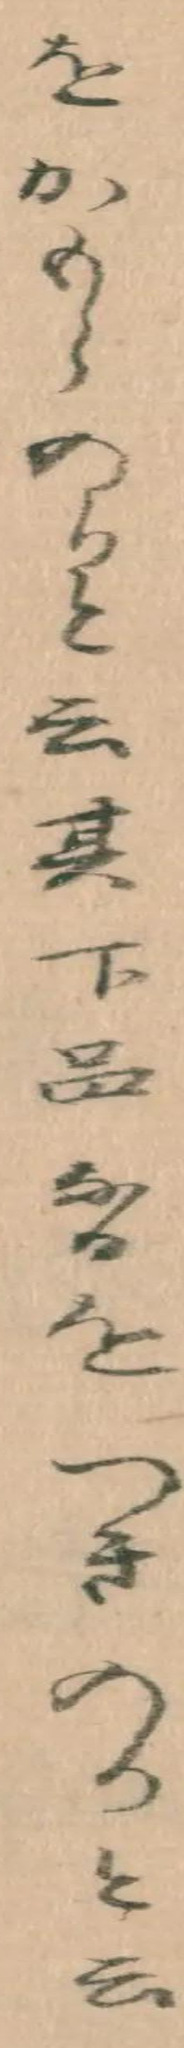をかもしのりと云其下品なるをつきのりと云
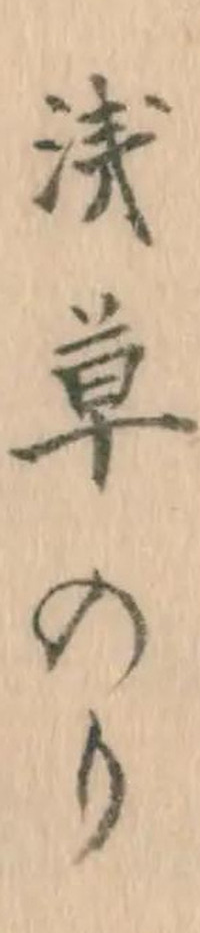浅草のり

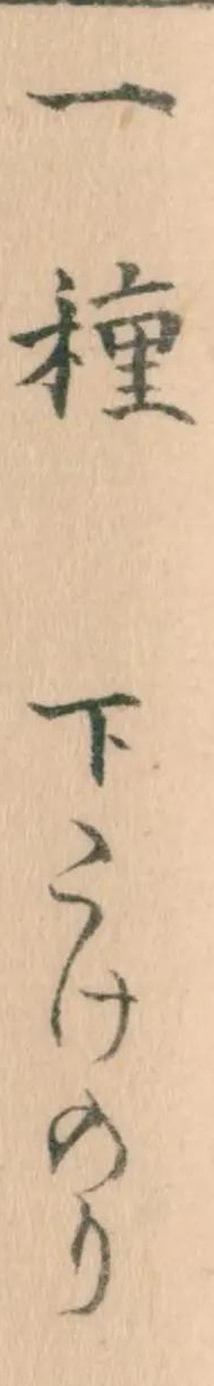一種下たけのり
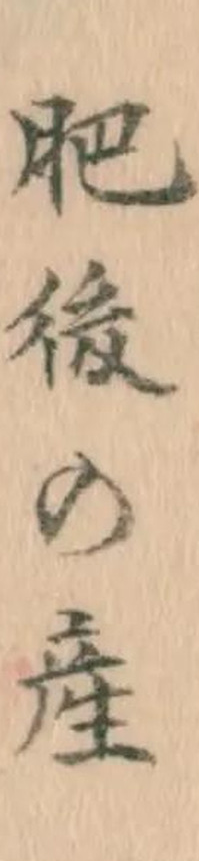肥後の産
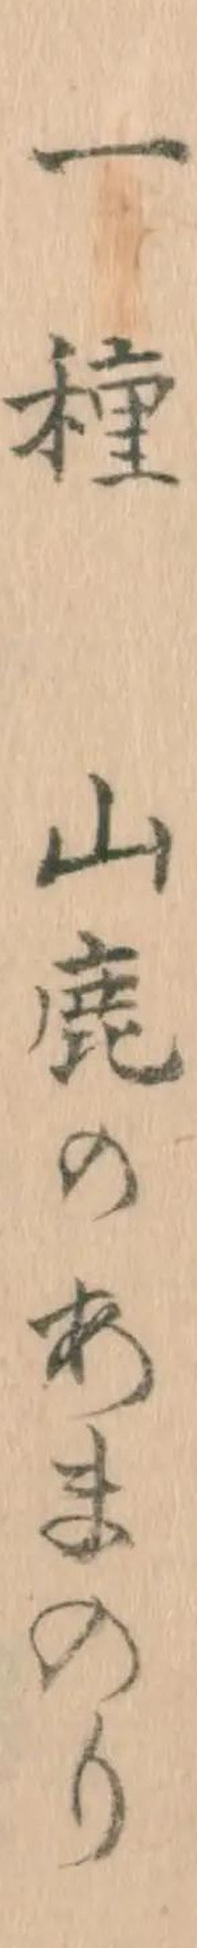一種山鹿のあまのり
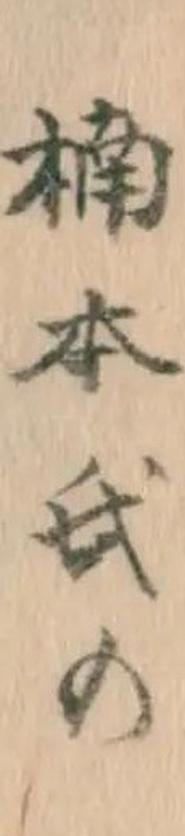楠本氏の

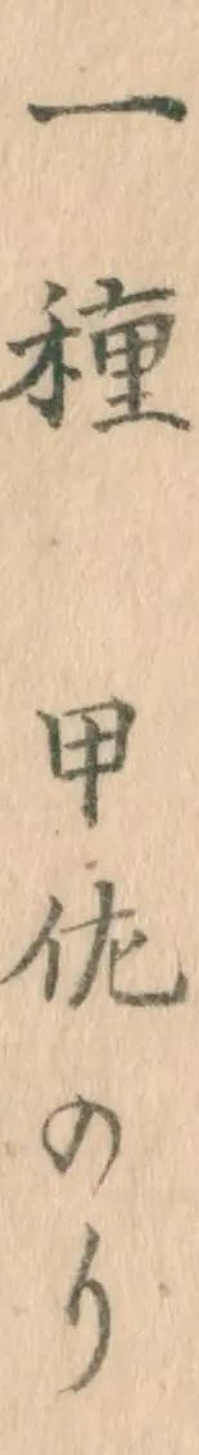一種甲佐のり
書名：本草図譜. 巻52-54
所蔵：国立国会図書館 National Diet Library, JAPAN
